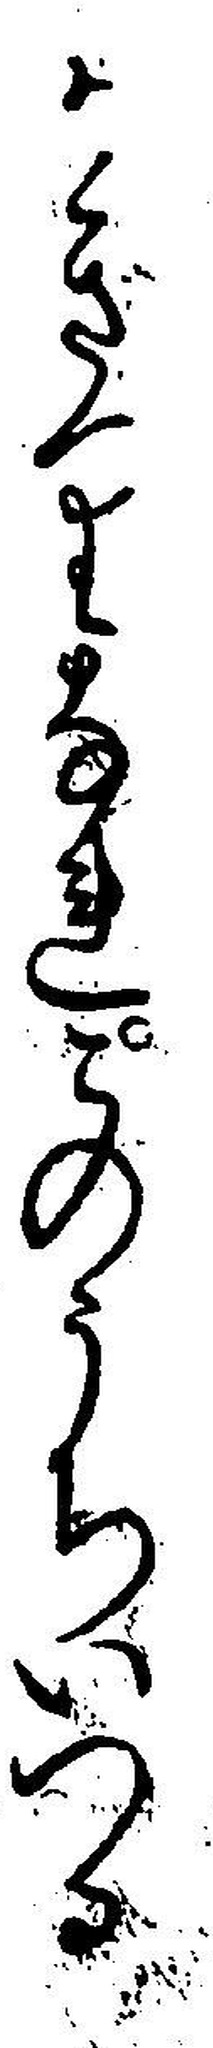かぎりなれ。このうちいつる
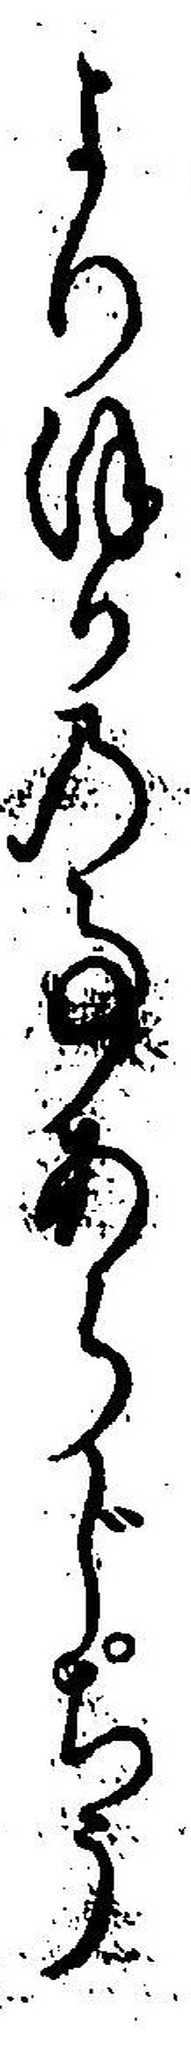よりほかの事あらじ。ちう
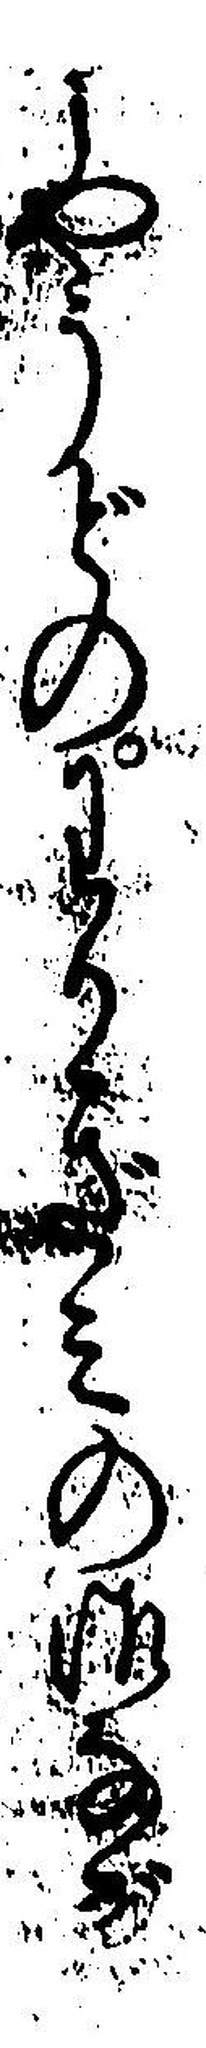しやうどの。わかぎみの御なご

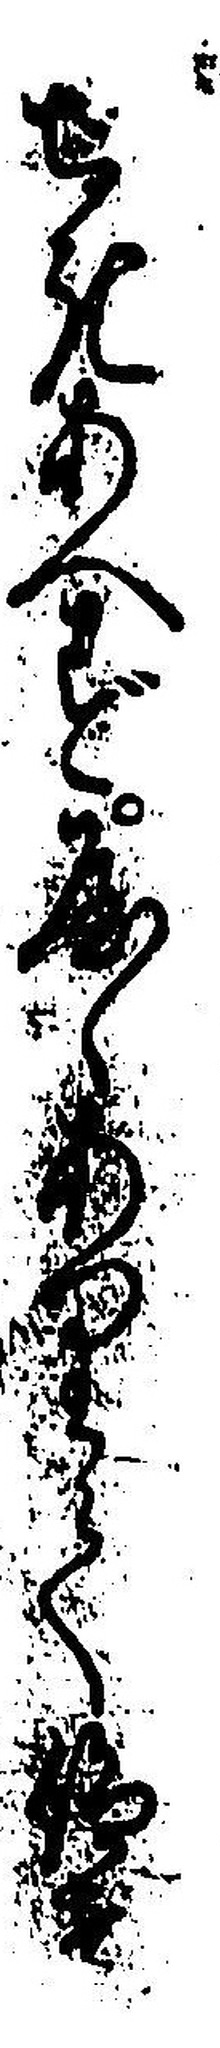せきあへず。やゝありて仰せ
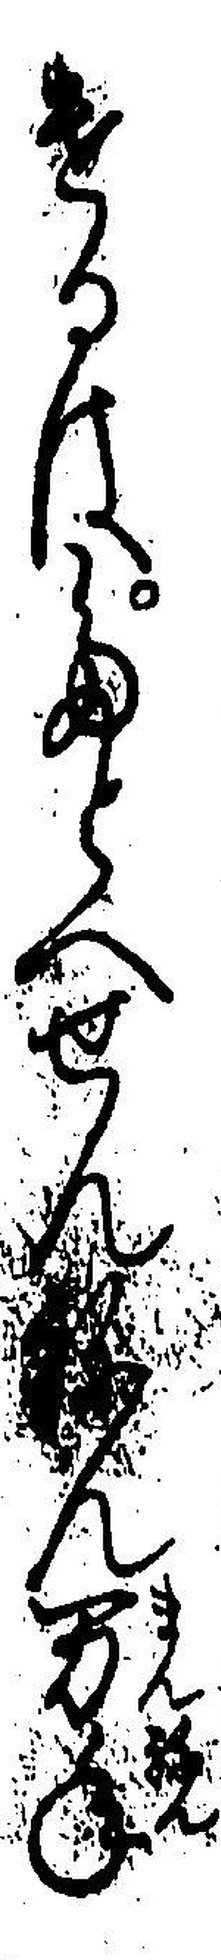けるは。たとへせんねん万年
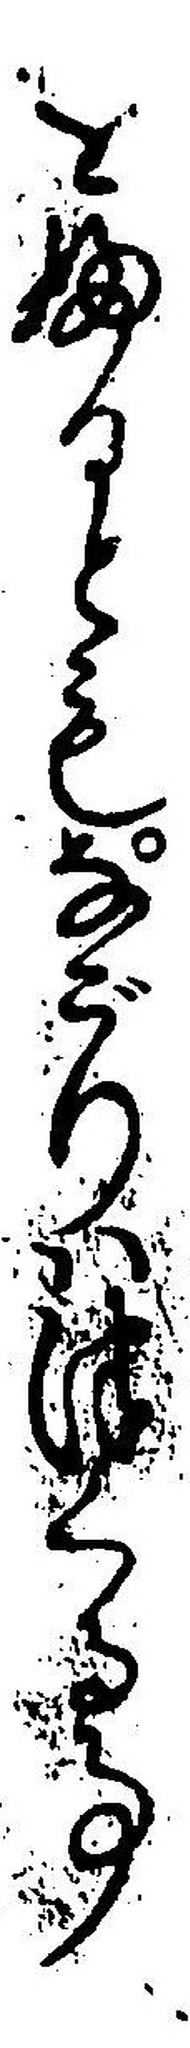をふるとも。なごりはつくる事
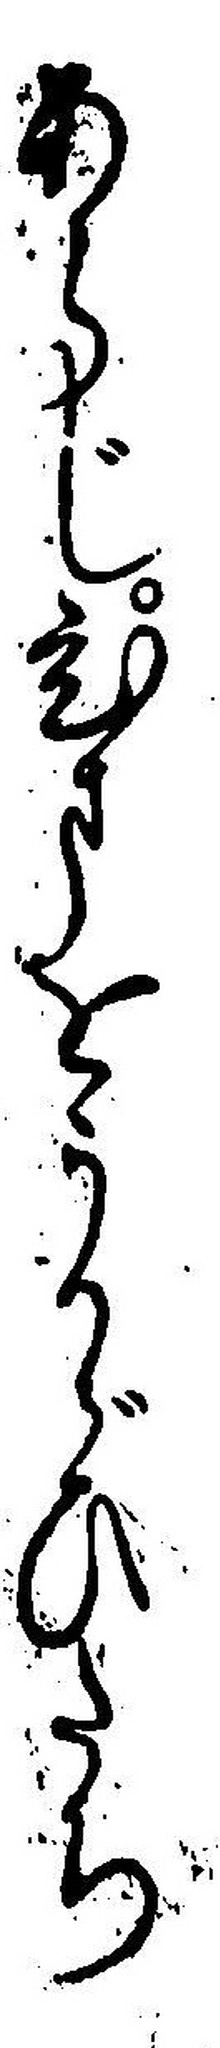あらじ。ひまをうかゞひたち
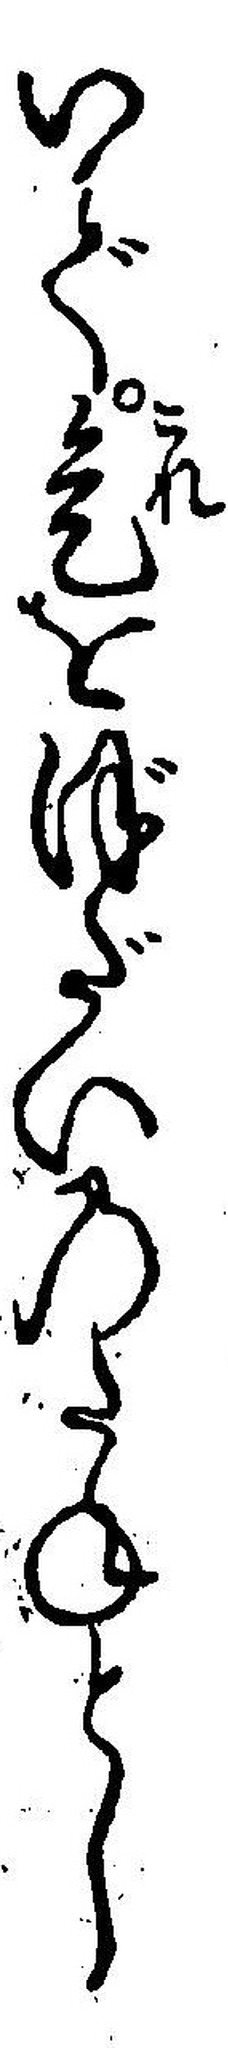いで。是をぼだいのたねとし
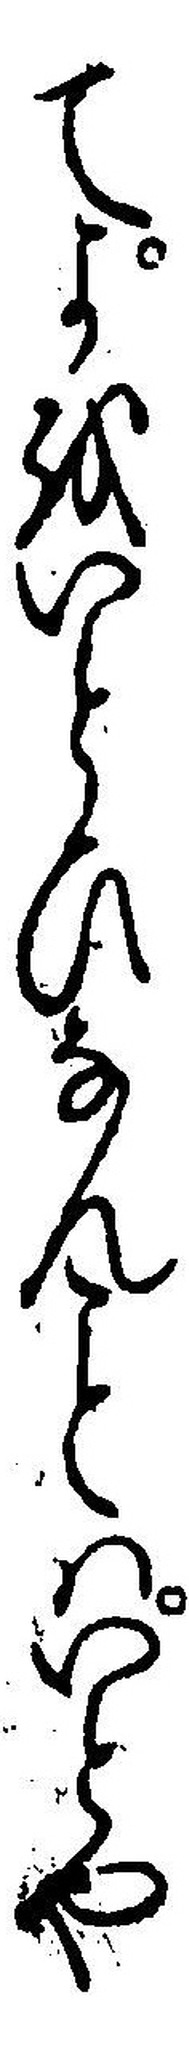て。よをいとひなんことは。いとや
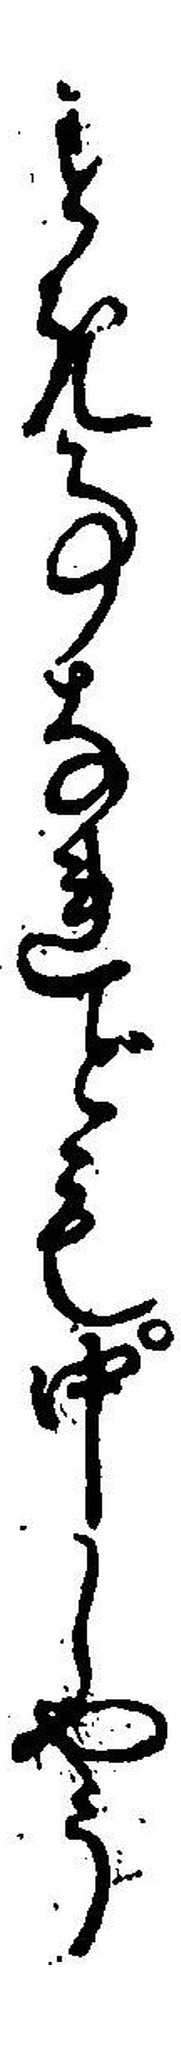すき事なれども。中しやう
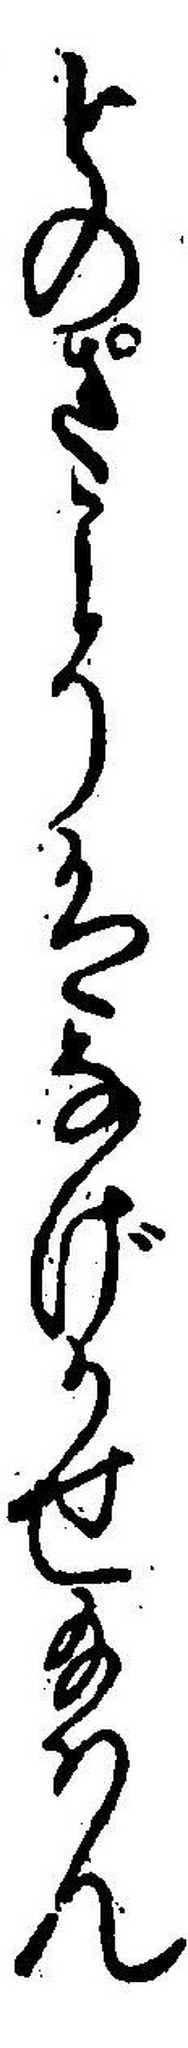との。さこそはなげかせ給はん
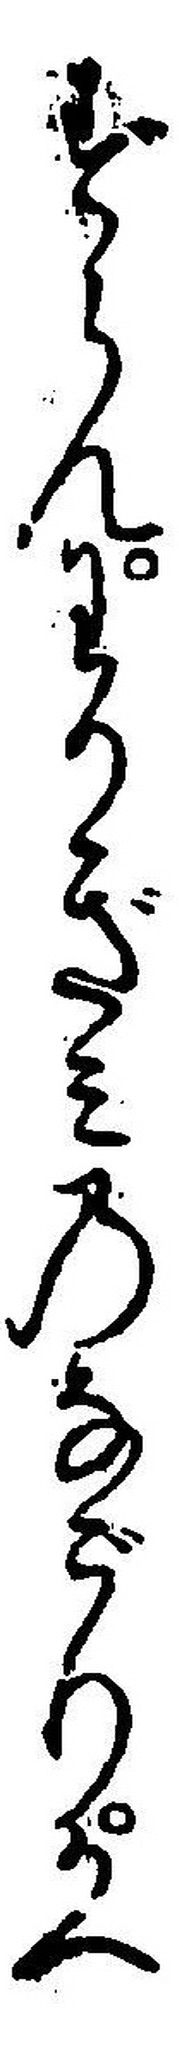ずらん。わかぎみのなごり。かへ
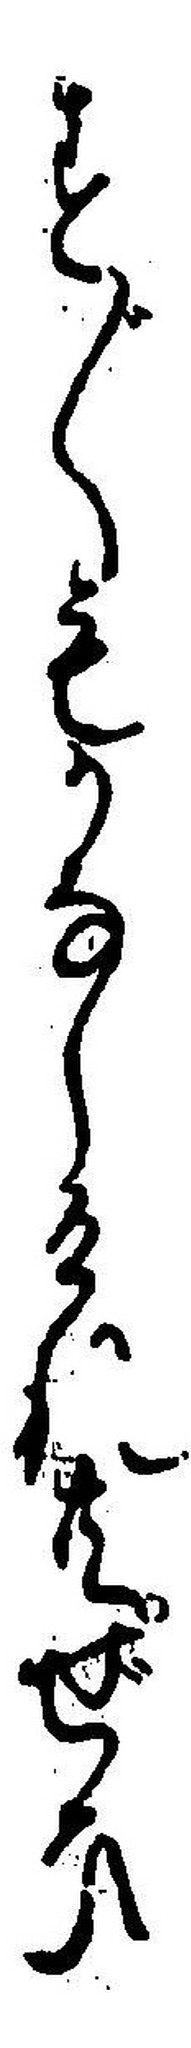す〴〵もかなしけれは。ぜひ
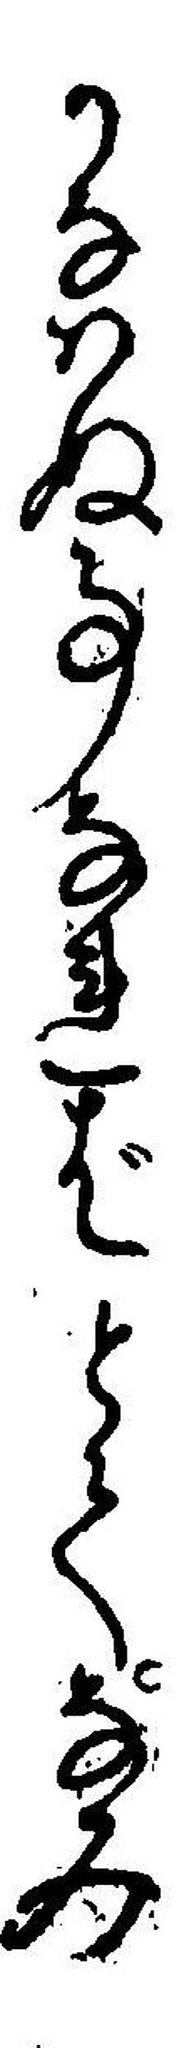かなはぬ事なればとて。なみ
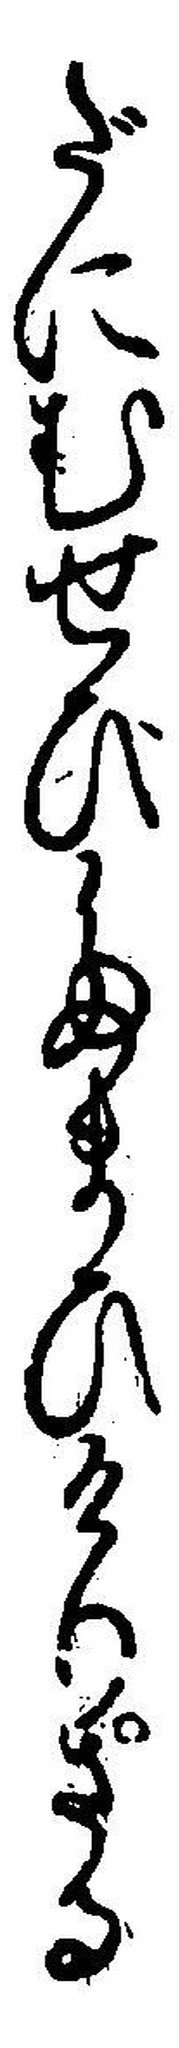だにむせびたまひけり。さる
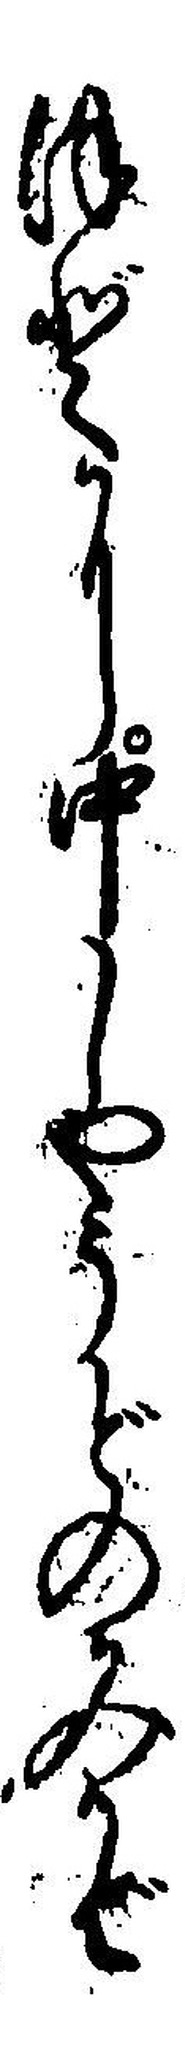ほどに。中しやうどのみかど
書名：木幡きつね
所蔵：東京大学総合図書館 General Library in the University of Tokyo, JAPAN
